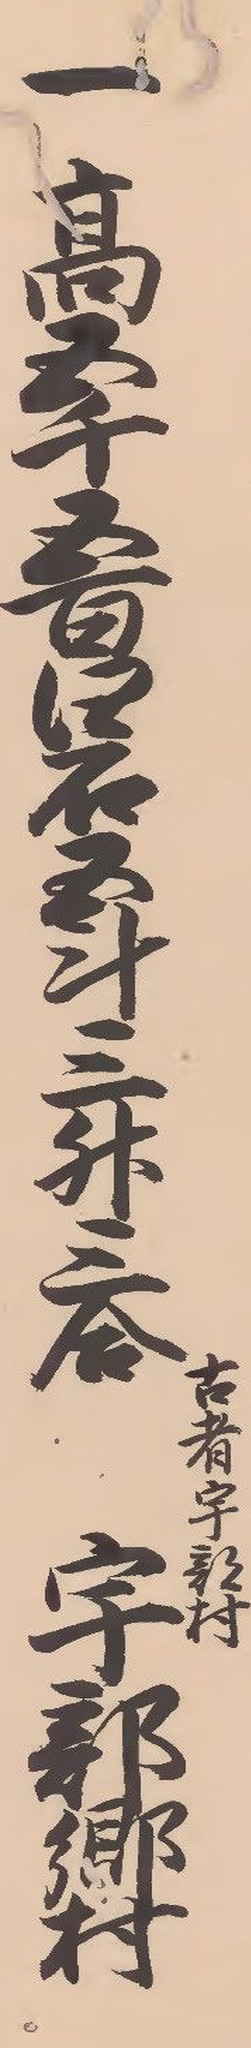一高五千五百四石五斗三升三合宇部郷村
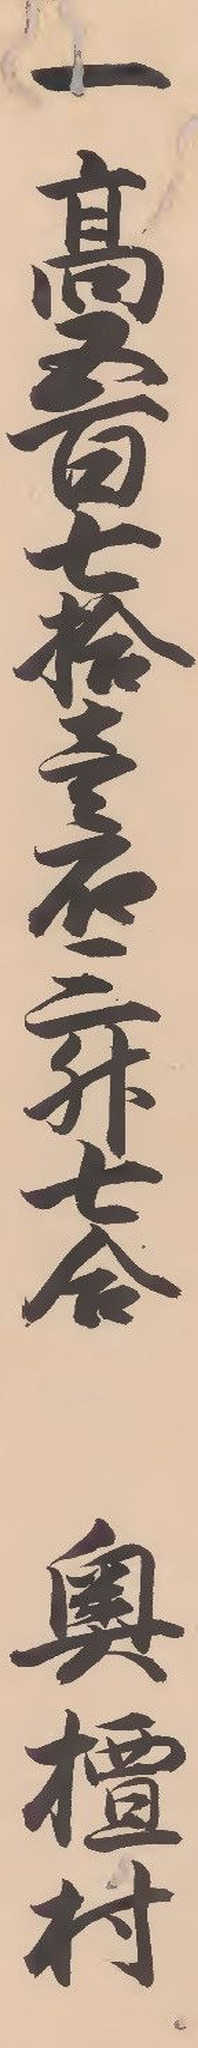一高五百七拾壱石三升七合奥檀村
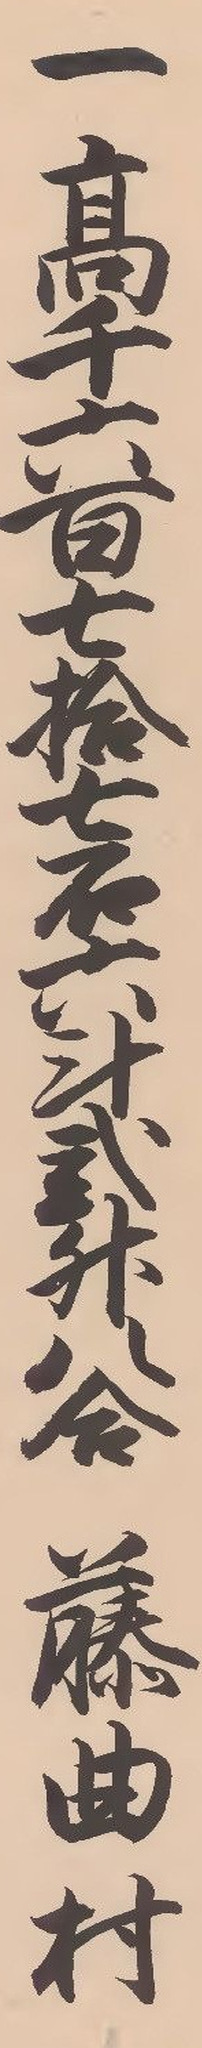一高千六百七拾七石六斗弐升八合藤曲村
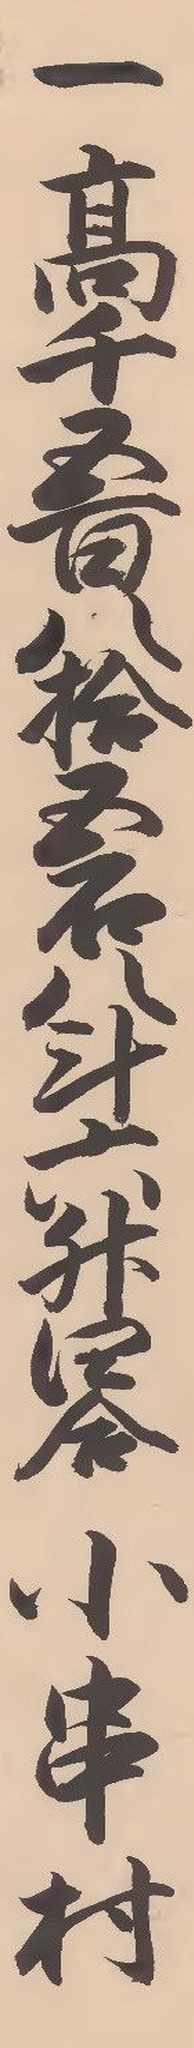一高千五百八拾五石八斗六升四合小串村
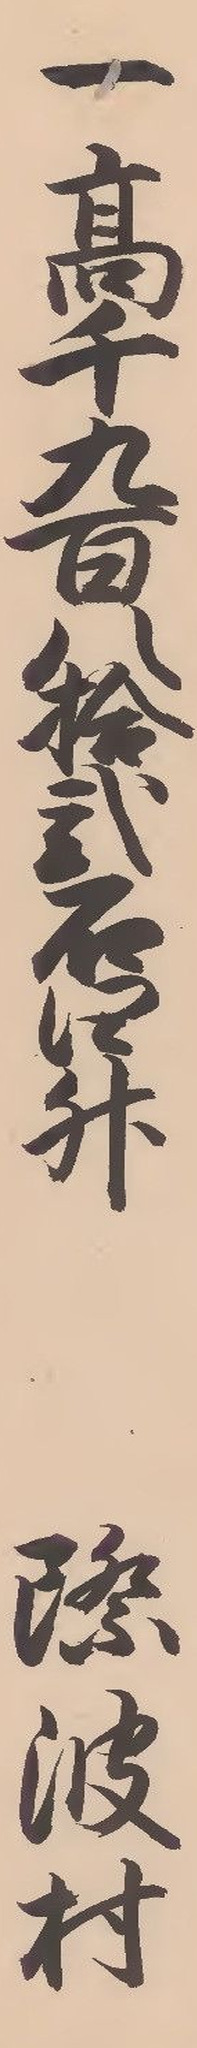一高千九百八拾弐石四升際波村

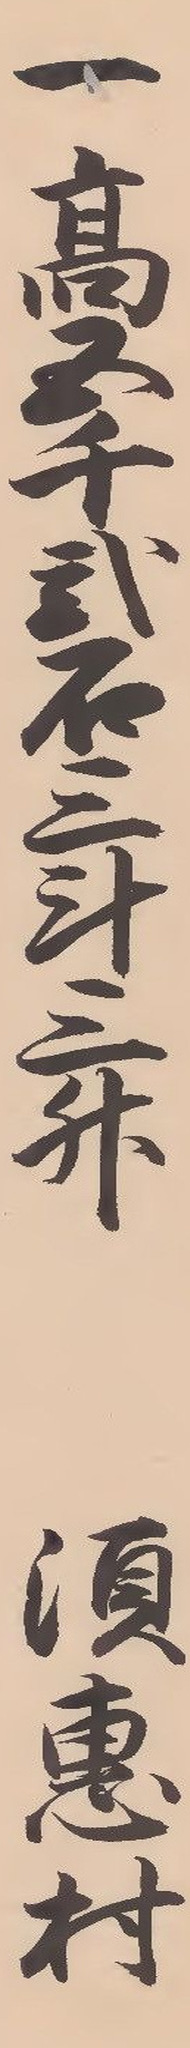一高五千弐石三斗三升須惠村
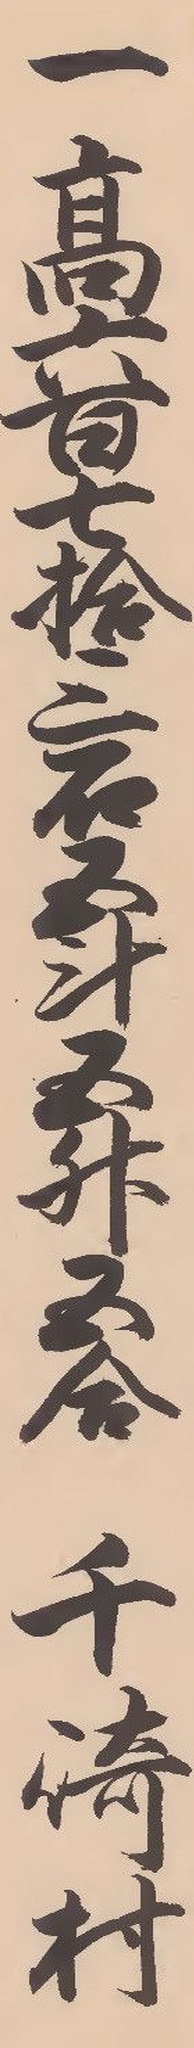一高六百七拾三石五斗五升五合千崎村
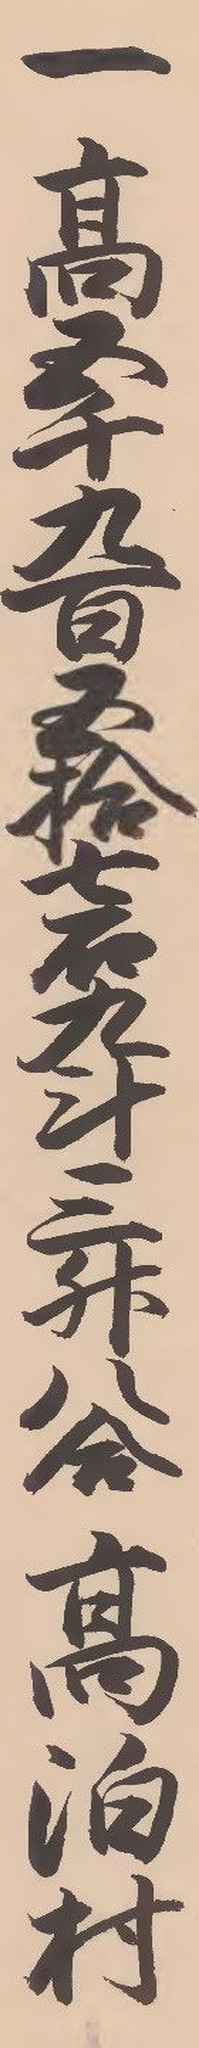一高五千九百五拾七石九斗三升八合高泊村
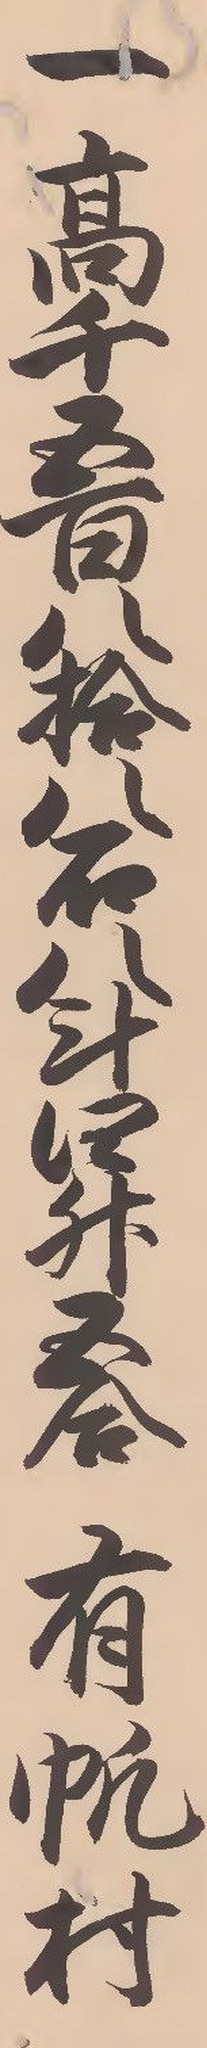一高千五百八拾八石八斗四升五合有帆村
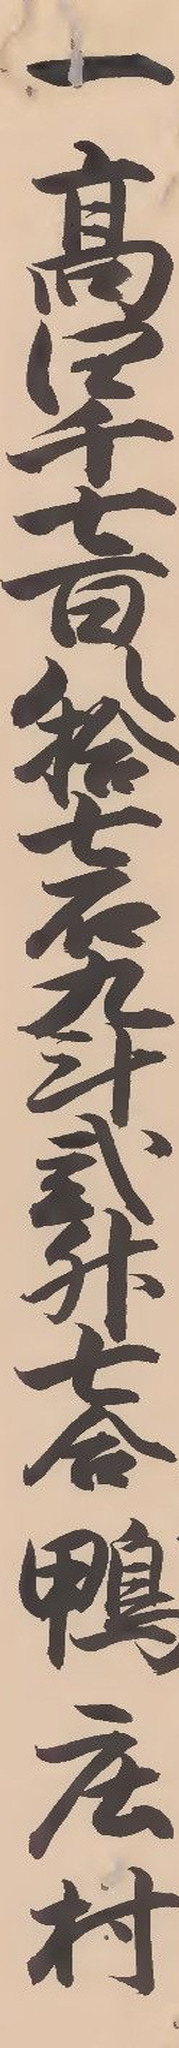一高四千七百八拾七石九斗弐升七合鴨庄村
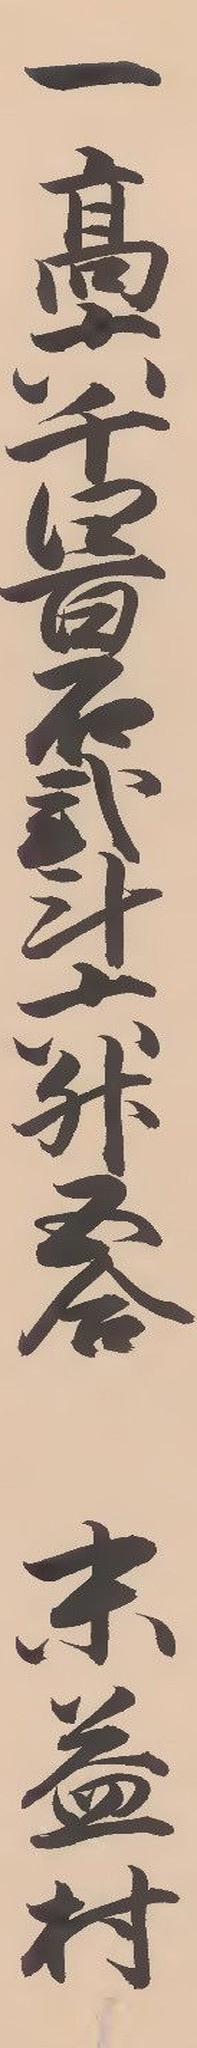一高六千四百石弐斗六升五合末益村
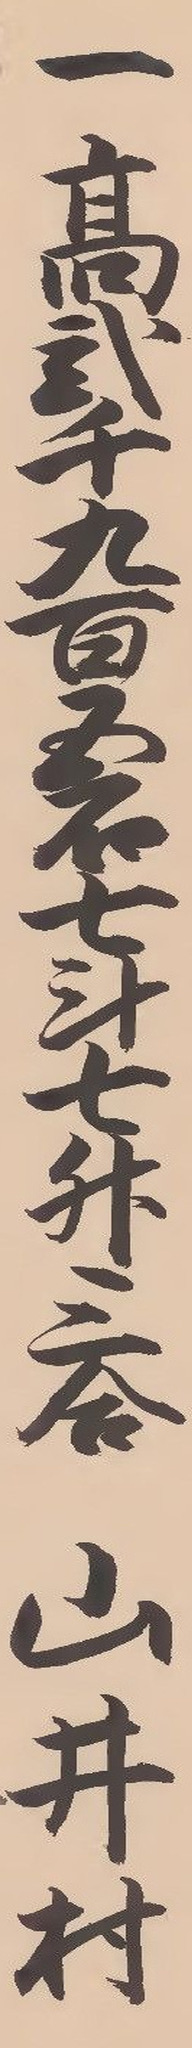一高弐千九百五石七斗七升三合山井村
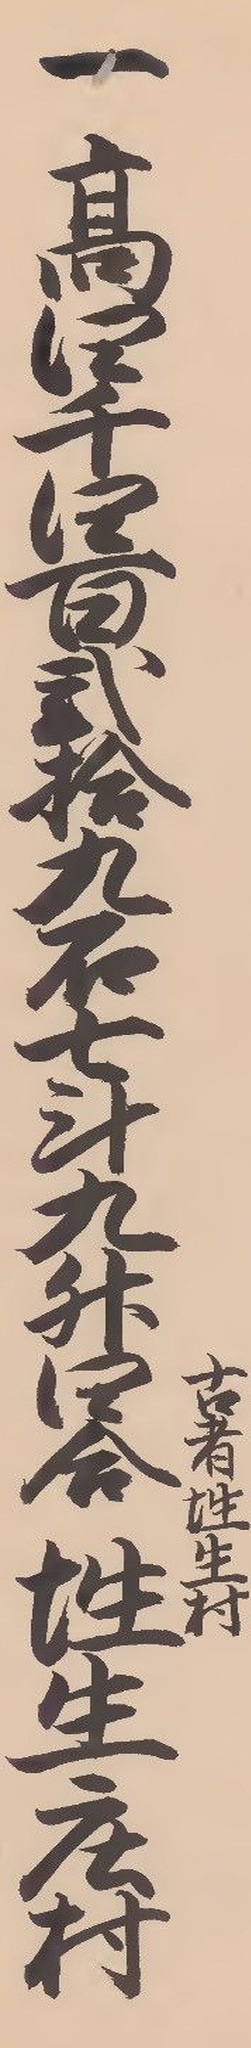一高四千四百弐拾九石七斗九升四合埴生庄村

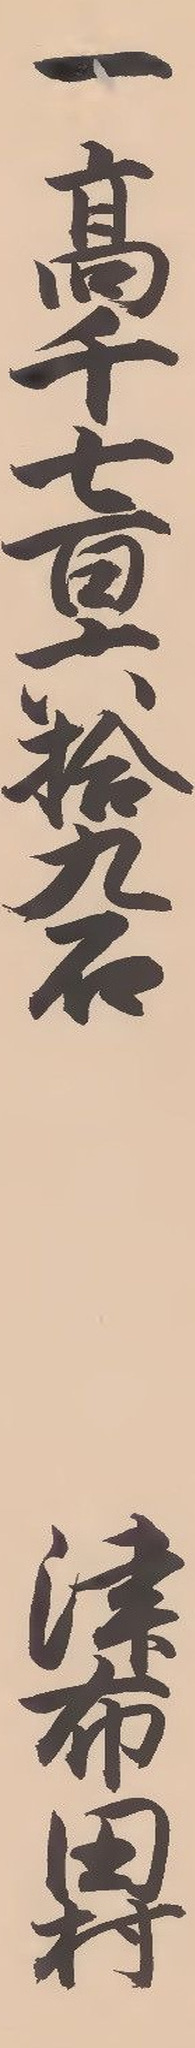一高千七百六拾九石津布田村
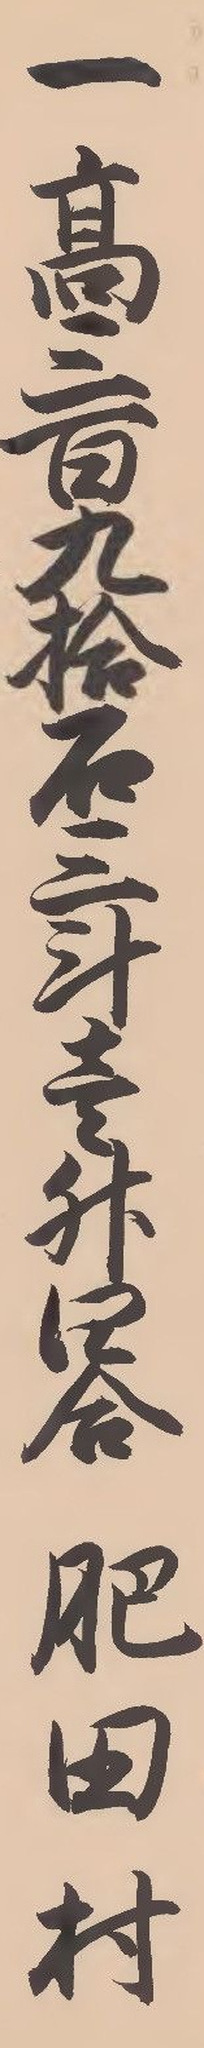一高三百九拾石三斗壱升四合肥田村
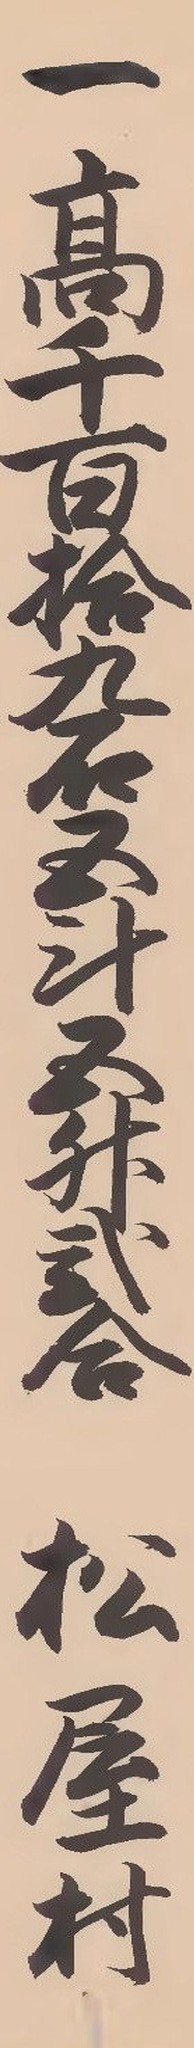一高千百拾九石五斗五升弐合松屋村
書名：長門国郷帳
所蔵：国立公文書館 National Archives of Japan
